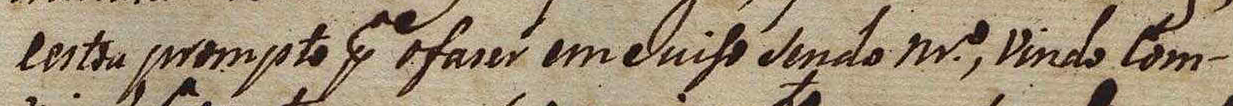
e estou prompto pa o fazer em Iuiso, sendo nr.o, vindo Com
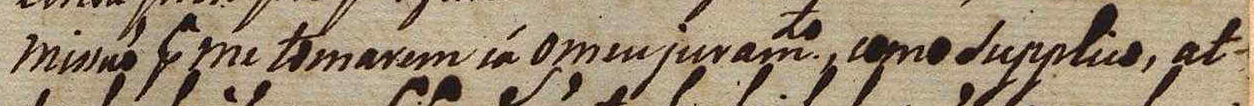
missaõ pa me tomarem cá o meu juram.to, como supplico, at
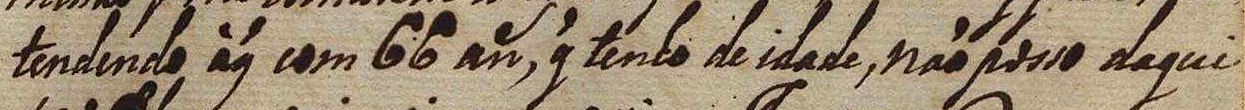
tendendo á q̄ com 66 ans, q̄ tenho de idade, naõ posso daqui
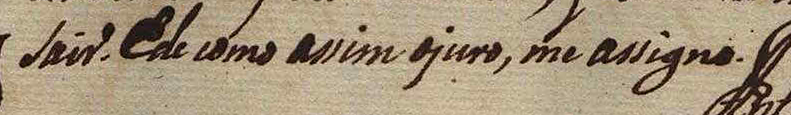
sair. E de como assim o juro, me assigno.
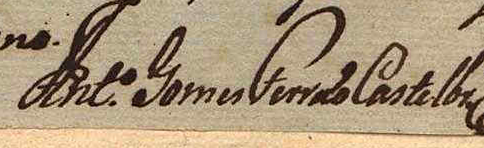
Ant.o Gomes Feraõ Castelbr.o
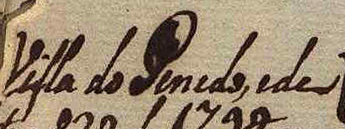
Villa do Penedo, e de
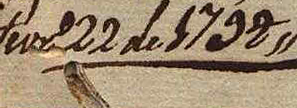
fevr.o 22 de 1794//
